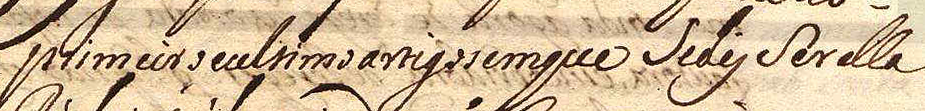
primeiro e ultimo artigos em que se dis Ser ella
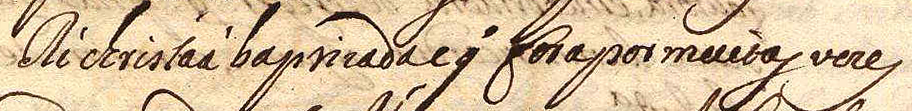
Rè christaã baptizada e q̄ fora por muitas vezes
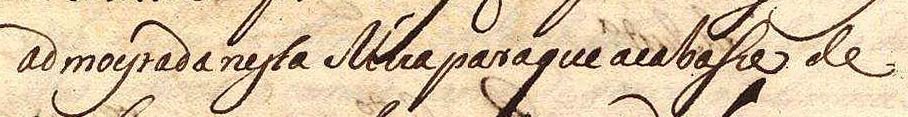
admoestada nesta Meza para que acabasse de
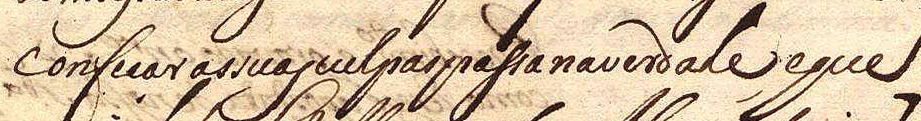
confeçar as suas culpas passa na verdade, e que
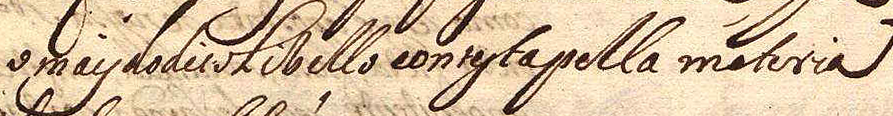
o mais do dito Libello contesta pella materia
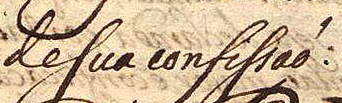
de sua confissaõ.
